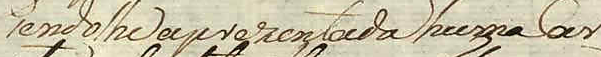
E sendolhe aprezentada huma Car
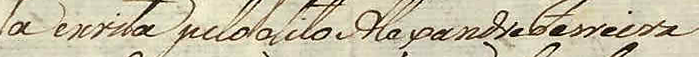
ta escrita pelo dito Alexandre Ferreira
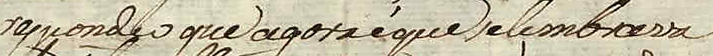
respondeo que agora é que se lembrava
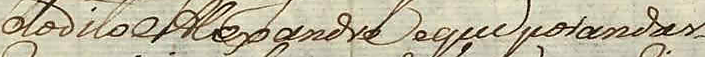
do dito Alexandre e que por andar
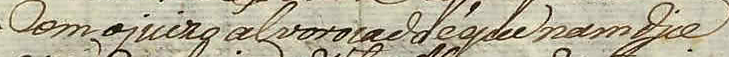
Com o juizo alvoroçado é que nam dice
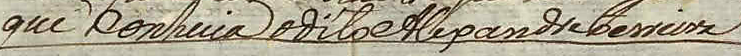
que Conhecia o dito Alexandre Ferreira
